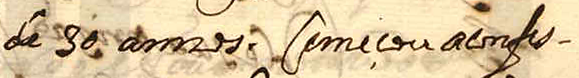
de 30 annos. Começou a confes
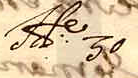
Id.e 30
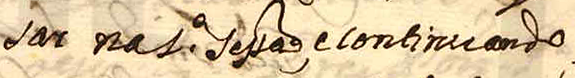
sar na 1.a sessão, e continuando
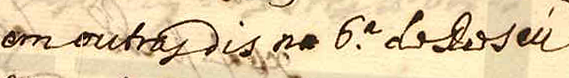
em outras dis na 6.a do Reo seu
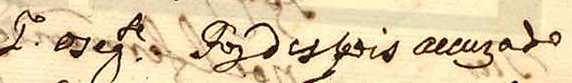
t.o o seg.te Foy despois accuzado
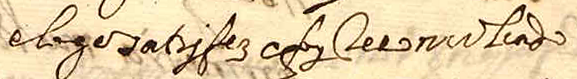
e logo satisfez e foy Reconceleado
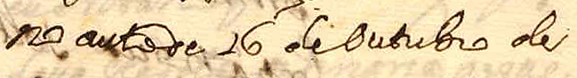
no auto de 16 de Outubro de
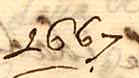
1667.
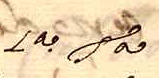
1.a Ta
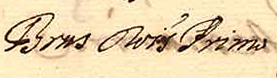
Bras Rois̄ Primo
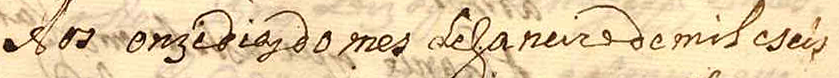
Aos onze dias do mes de Janeiro de mil e seis
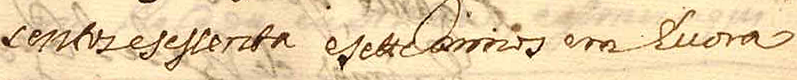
sentos e sessenta e sette annos em Euora
